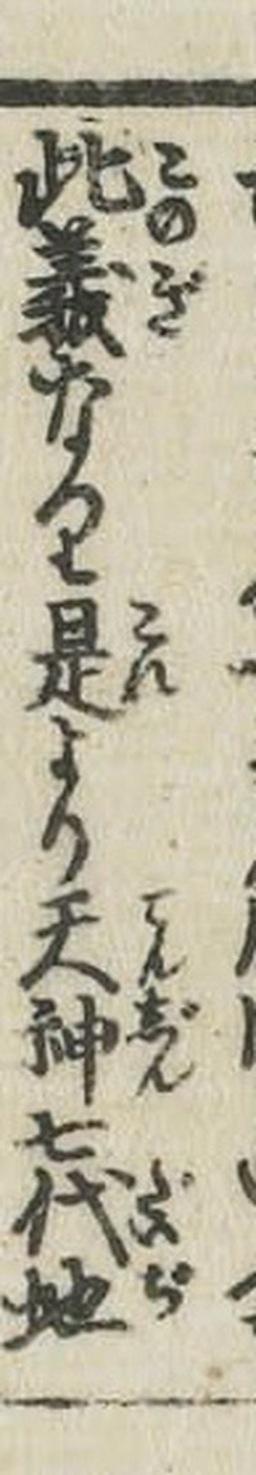此義なり是より天神七代地
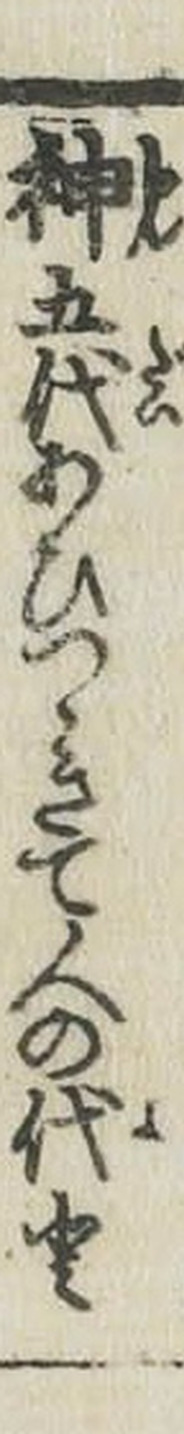神五代あひつゝきて人の代と
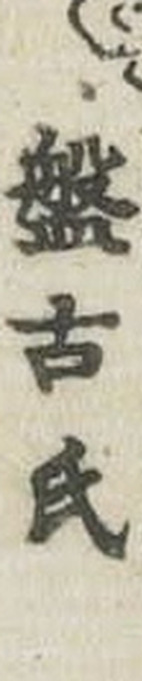盤古氏
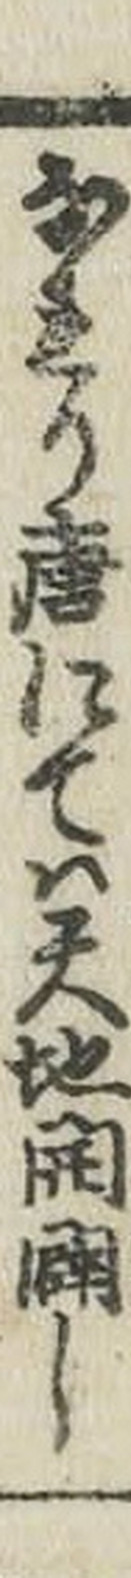なれり唐にては天地開闢し
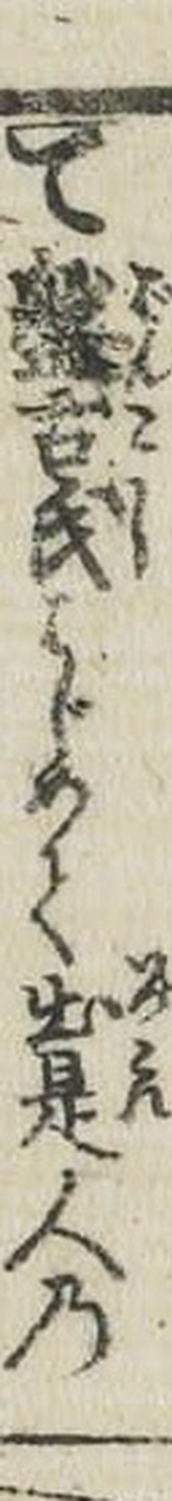て盤古氏はじめて出是人の
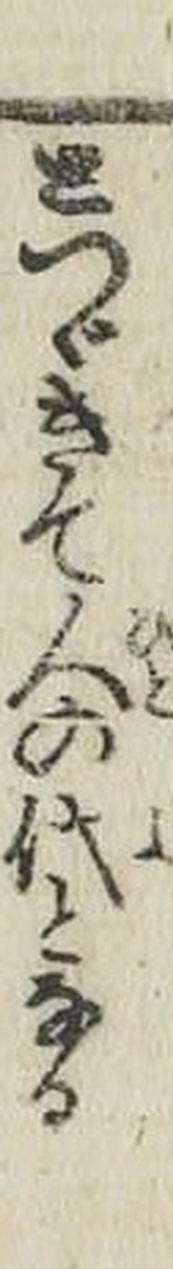とつゞきて人の代となる
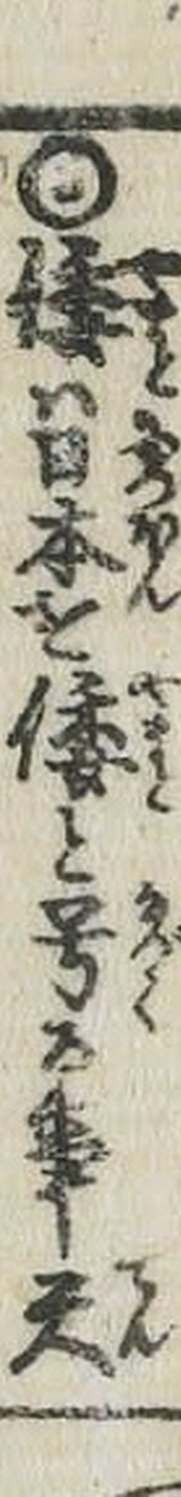○倭は日本を倭と号る事天
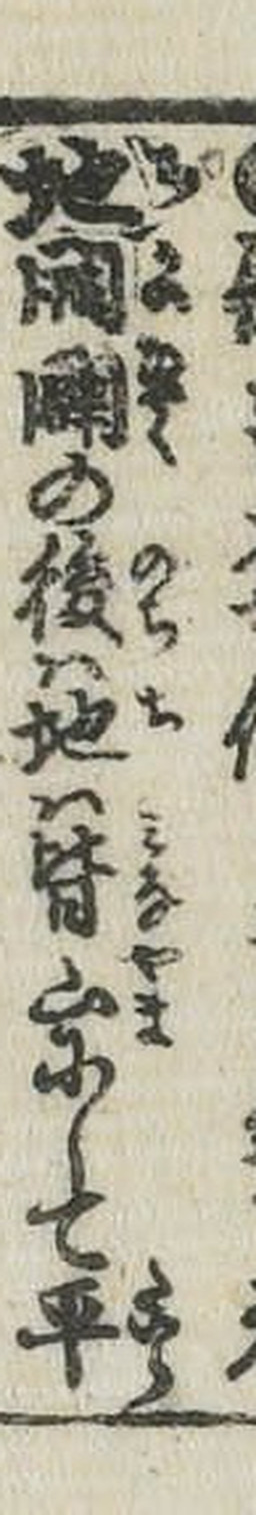地開闢の後は地は皆山にして平
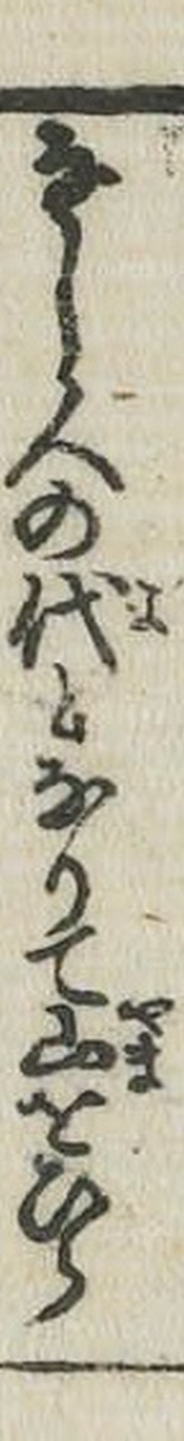なし人の代となりて山をひら
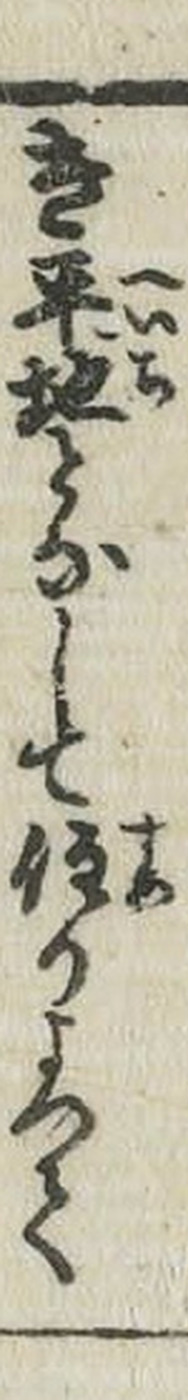き平地となして住りよつて
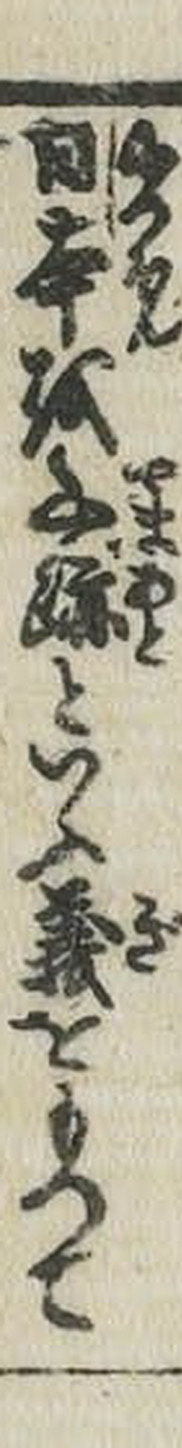日本を山跡といふ義をもつて
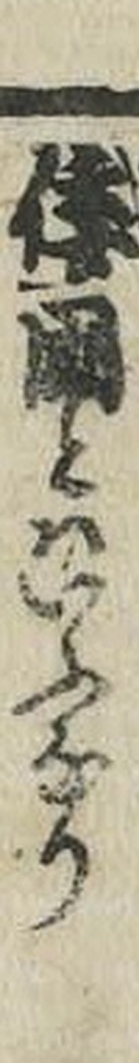倭国とはいふなり

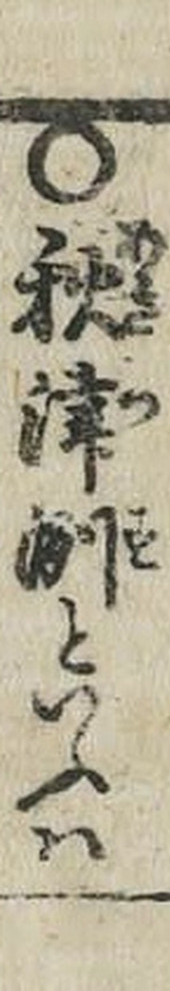○秋津洲というは
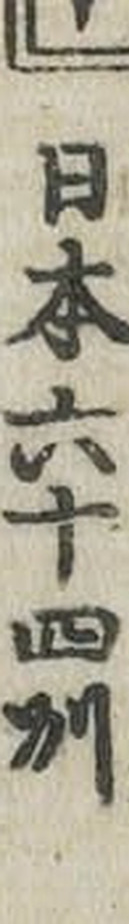日本六十四州
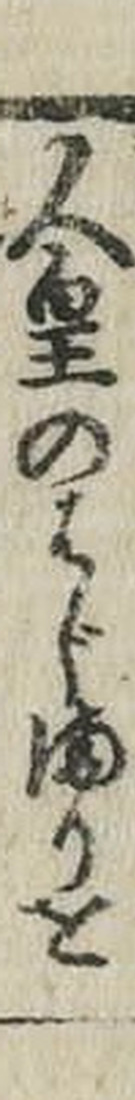人皇のはじまりを
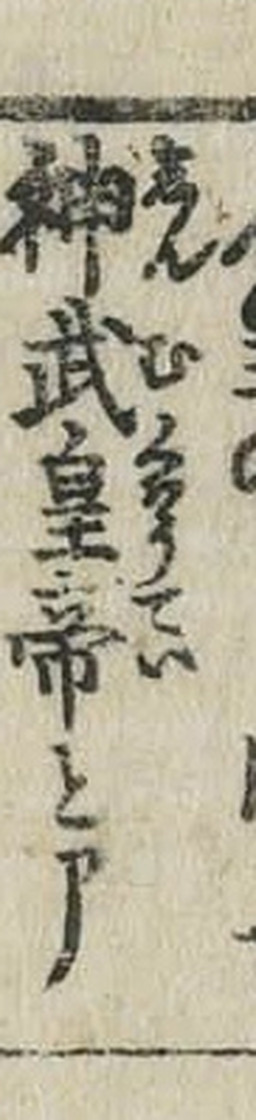神武皇帝と申
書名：増補頭書訓蒙図彙大成 10巻 2:巻之1-3
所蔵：東京学芸大学教育コンテンツアーカイブ
